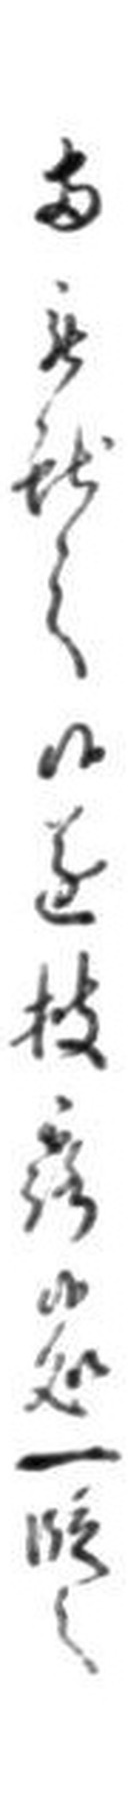両被献之候遂披露候処一段之
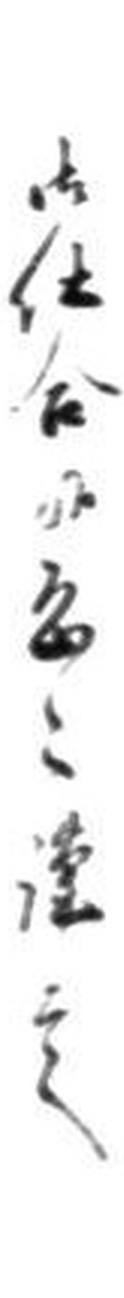御仕合候恐々謹言
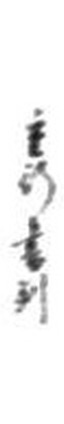重行書判
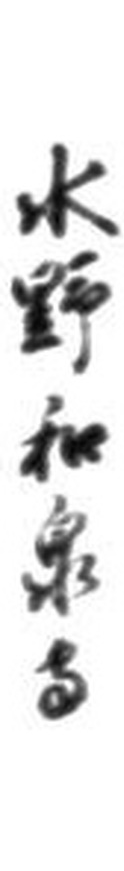水野和泉守
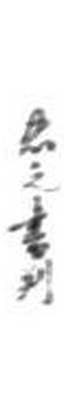忠之書判
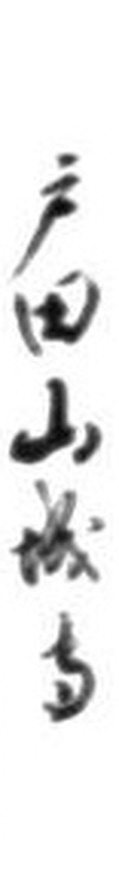戸田山城守
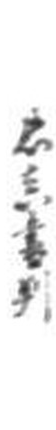忠真書判
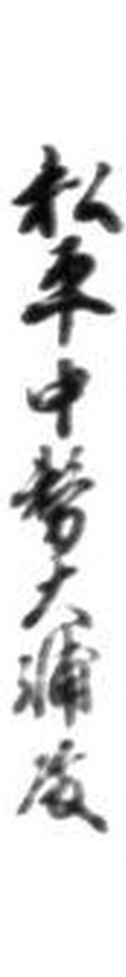松平中務大輔殿

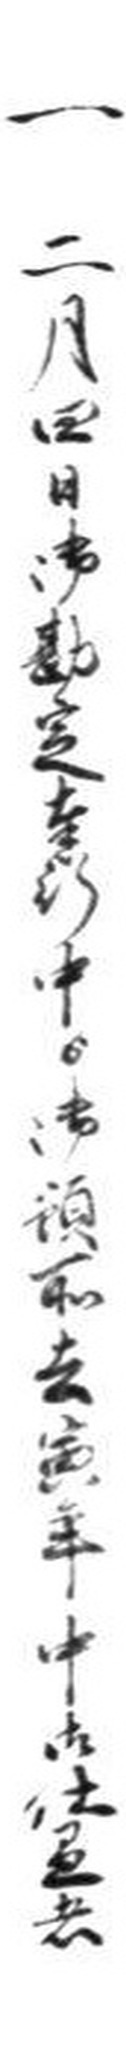一二月四日御勘定奉行中ゟ御領所去寅年中於仕置者
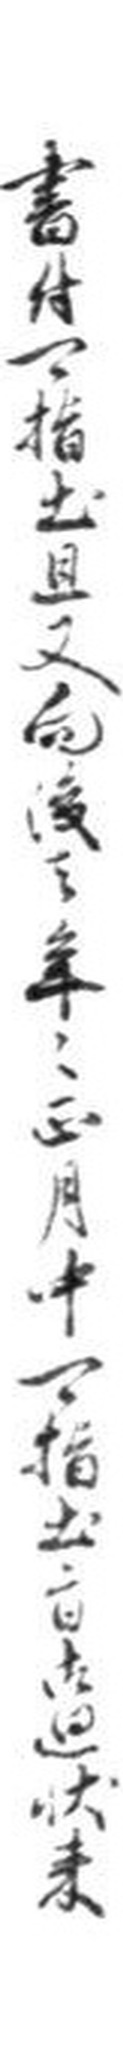書付可指出且又向後者年々正月中可指出旨御廻状来
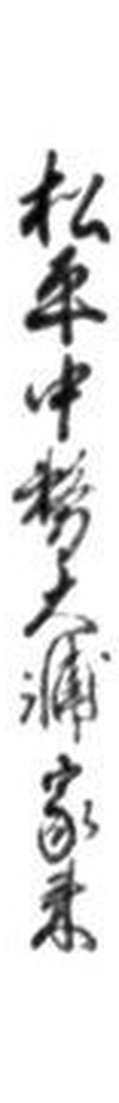松平中務大輔家来
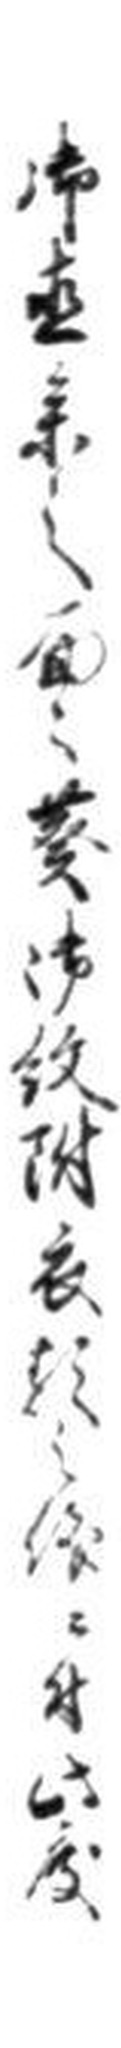御直参之面々葵御紋付衣類之儀ニ付此度
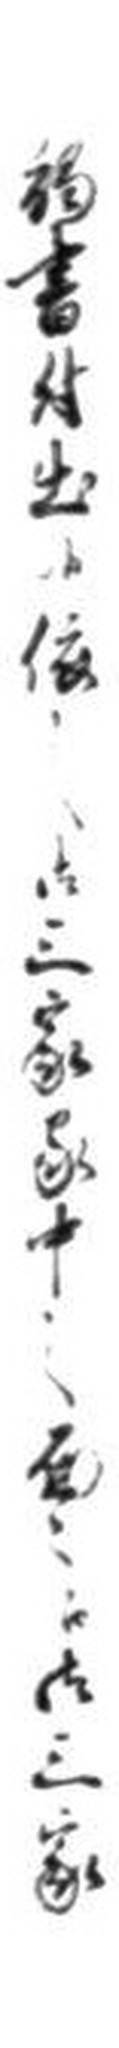触書付出候依之御三家家中之面々江御三家
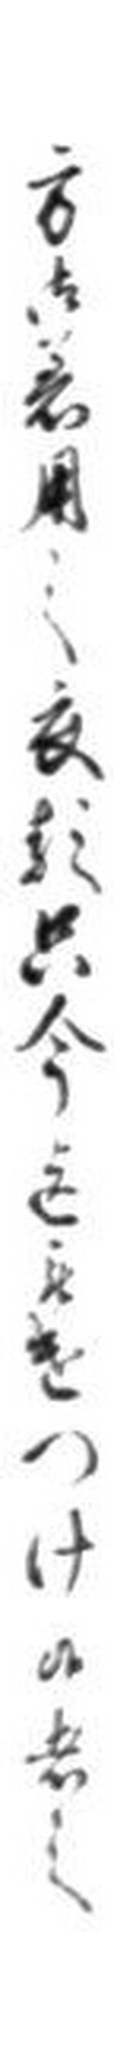方御着用之衣類只今迄被遣つけ候者之
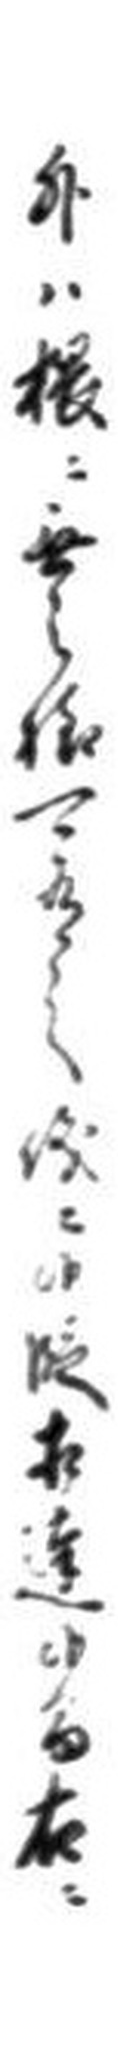外ハ猥ニ無之様可有之儀ニ候段相達候間右ニ
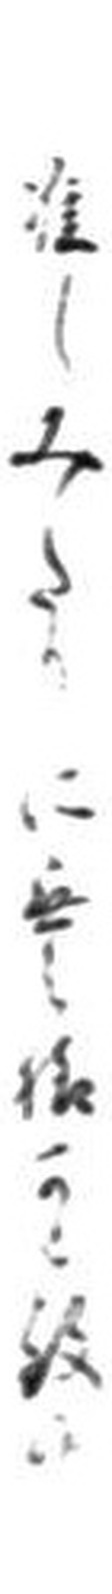准しみたりに無之様可被致候
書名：家譜 三十六 宗昌公 従享保八年到同九年
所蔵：福井県文書館 Fukui Prefectural Archives
